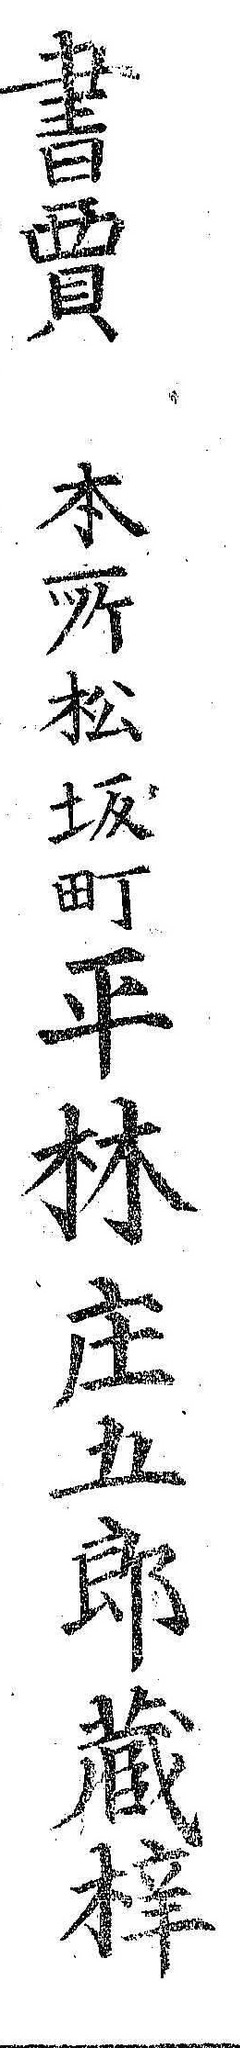書賈本所松坂町平林庄五郎蔵梓
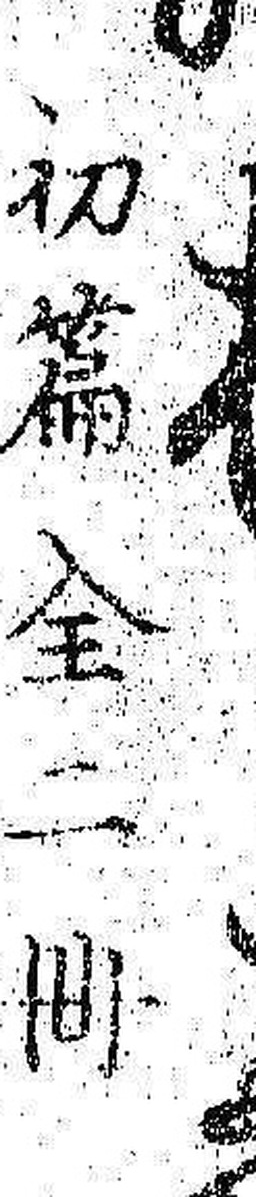初篇全二冊
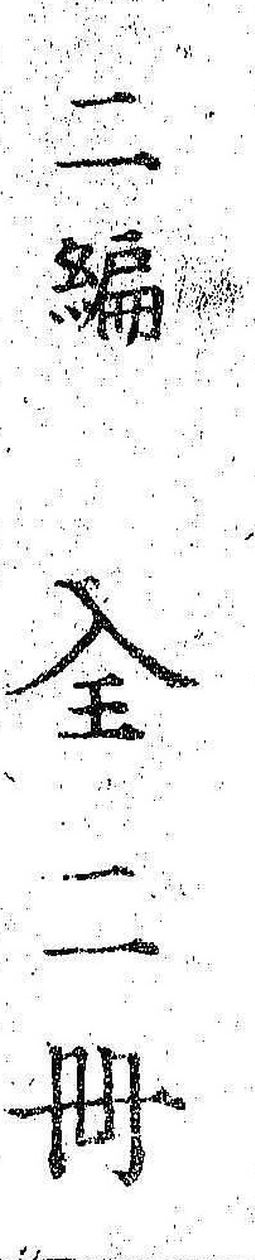初篇全二冊
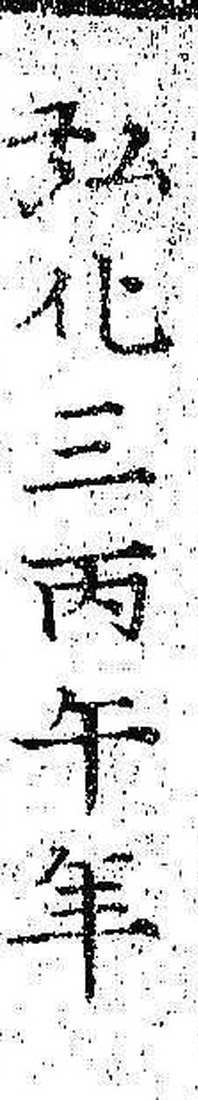弘化三丙午年
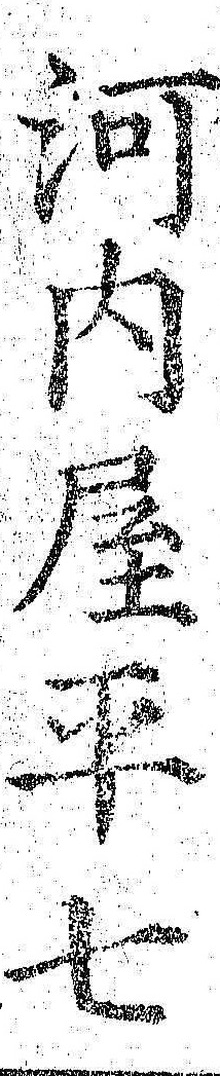河内屋平七
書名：昔話稲妻表紙
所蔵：国文学研究資料館
